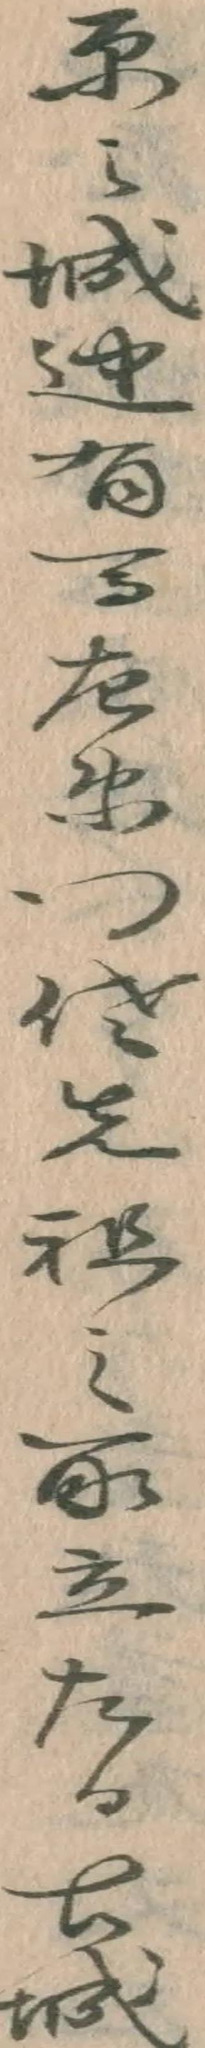原之城迚有馬左衛門佐先祖之取立たる古城
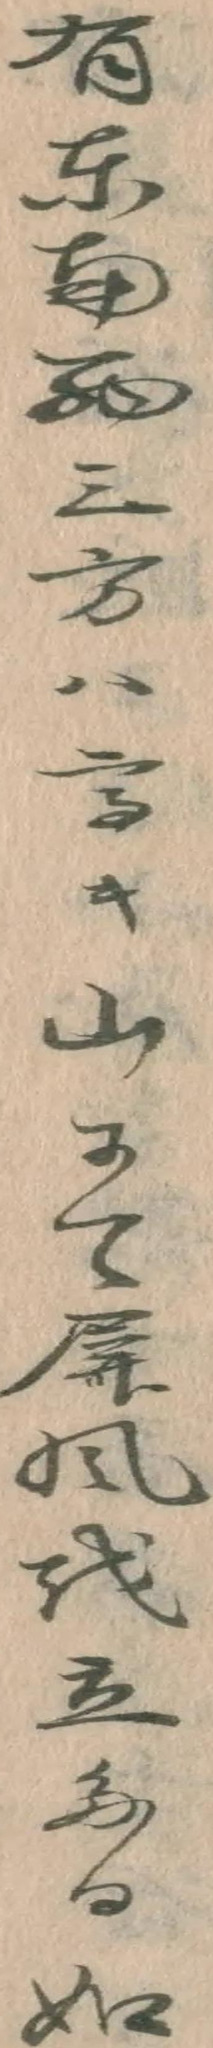有東南西三方は高き山にて屏風を立たる如
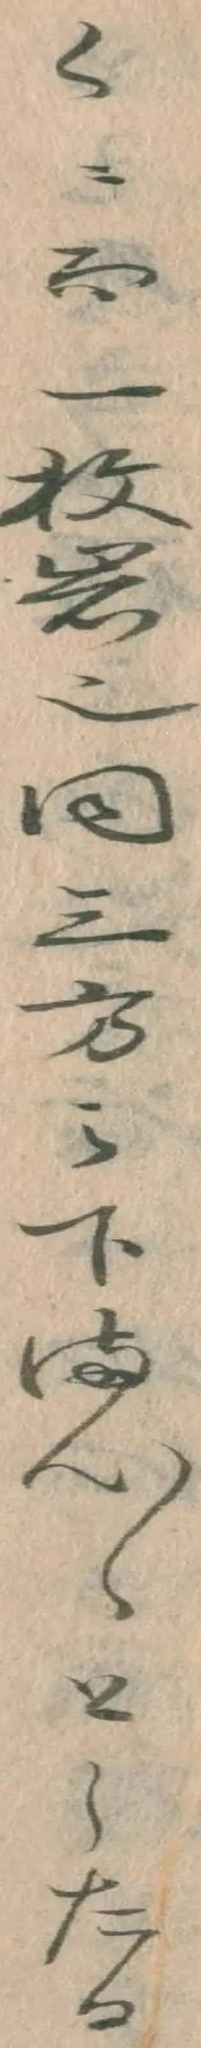くに而一枚岩也同三方之下まん〳〵としたる
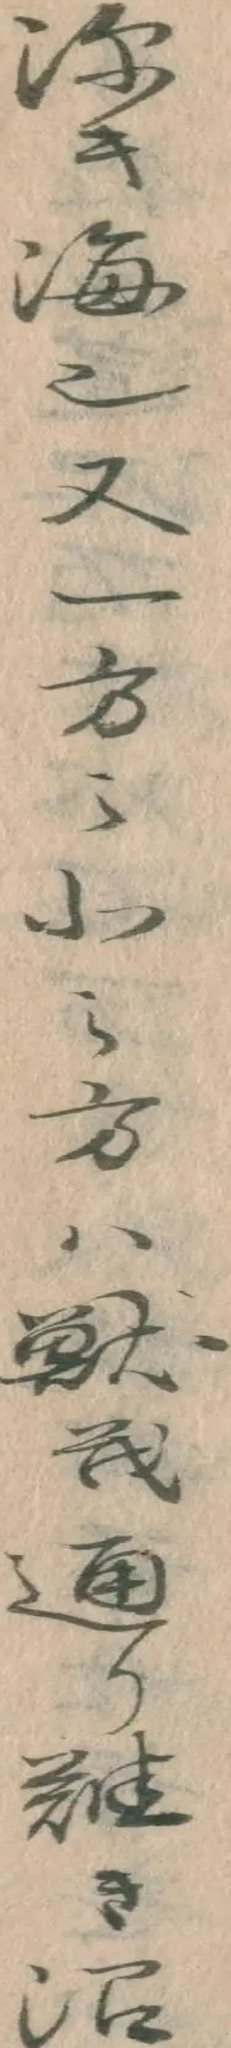深き海也又一方之北之方は獣も通り難き沼
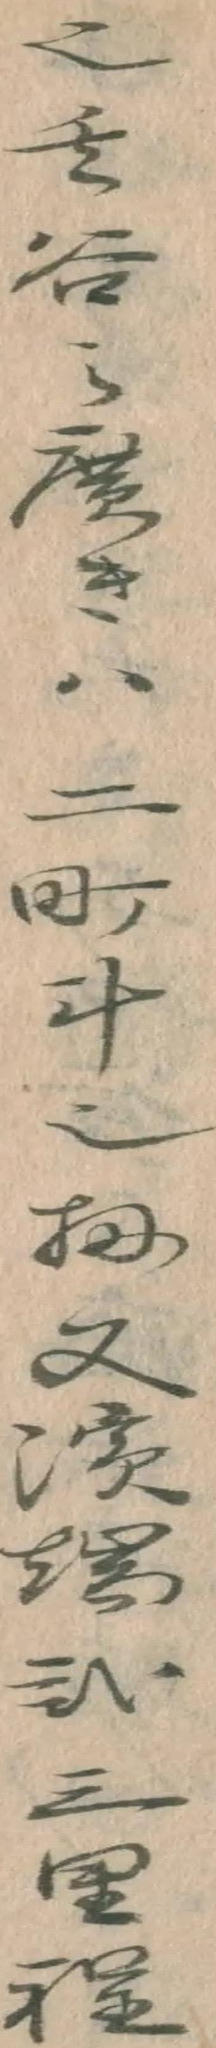也其谷之広きは二町計也扨又浜端弐三里程
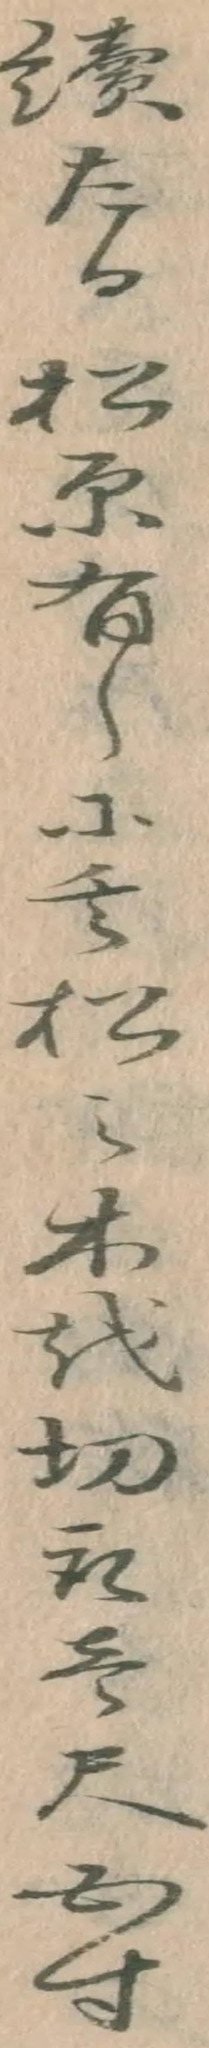続たる松原有しに其松之木を切取壱尺五寸
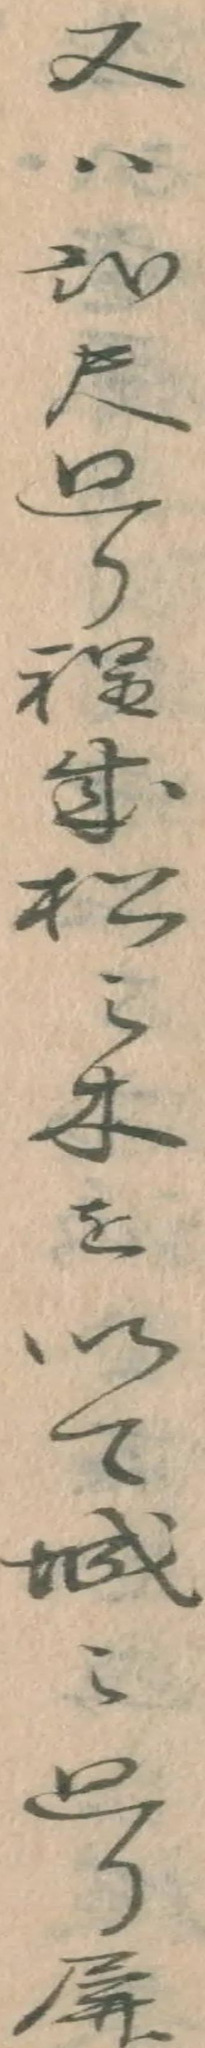又は弐尺廻り程成松之木を以て城之廻り屏

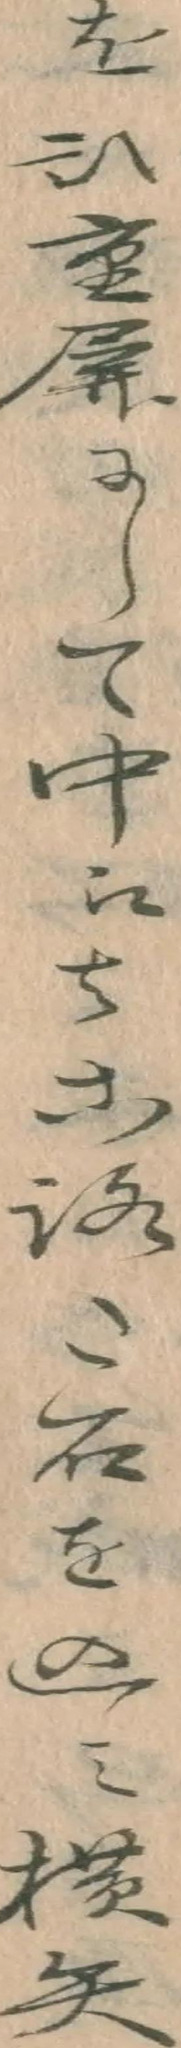を弐重屏にして中江はころた石を込み横矢
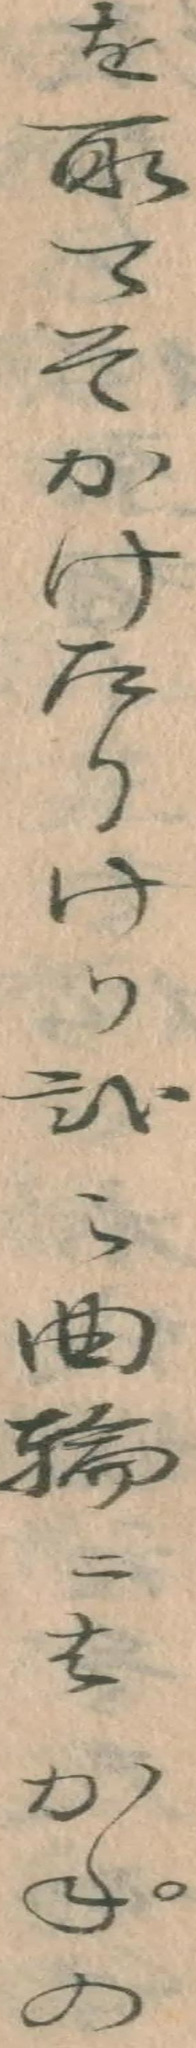を取てそかけたりけり弐之曲輪にはかねの
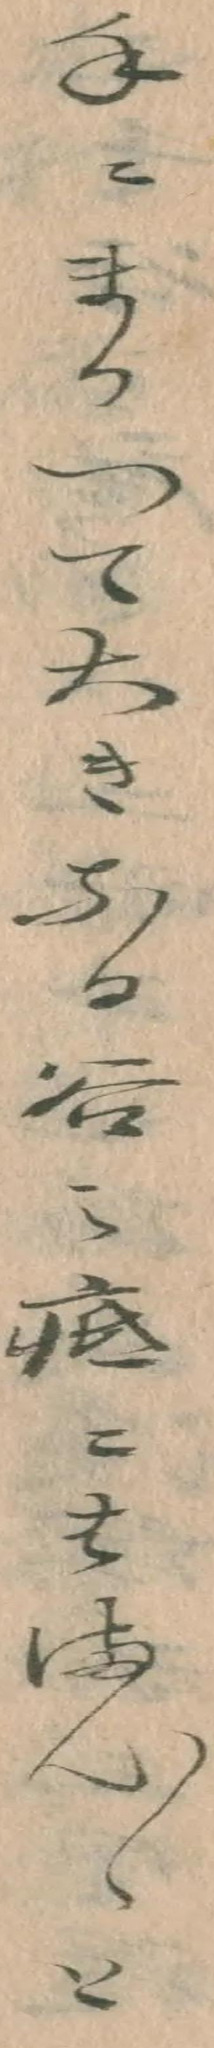手にまかつて大きなる谷之底にはまん〳〵と
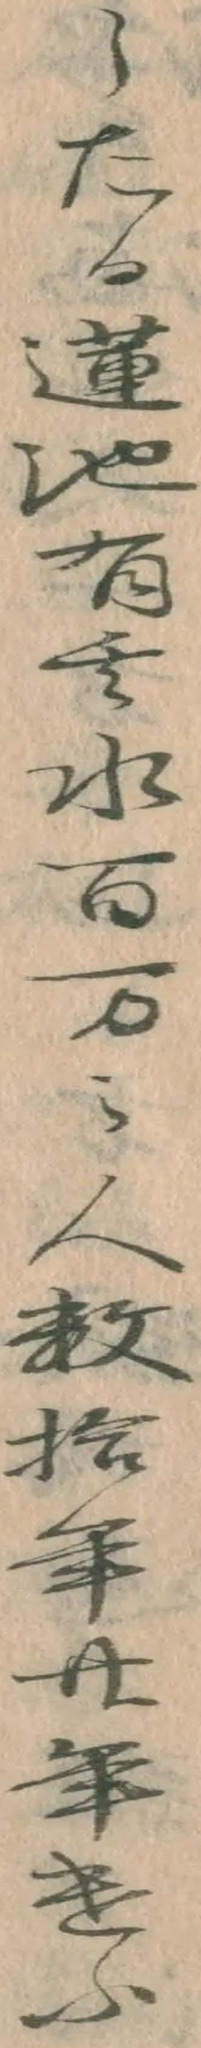したる蓮池有其水百万之人数拾年廿年遣ふ
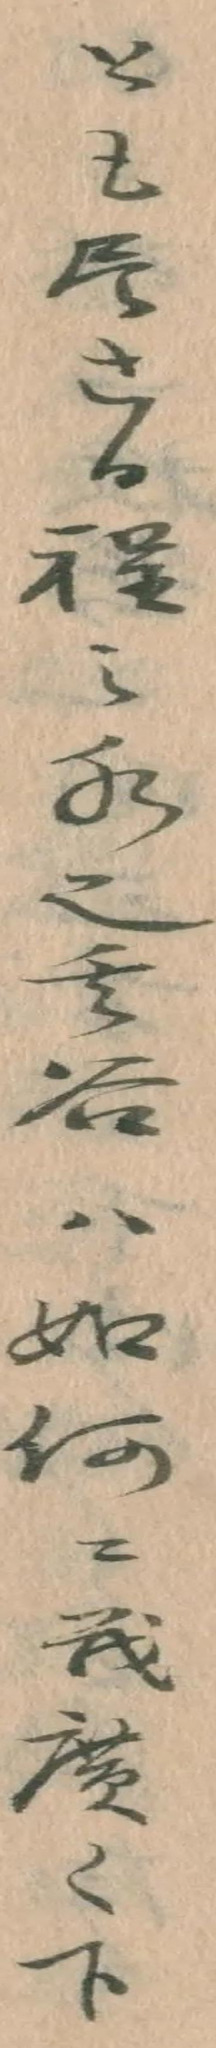とも尽さる程之水也其谷は如何にも広く下
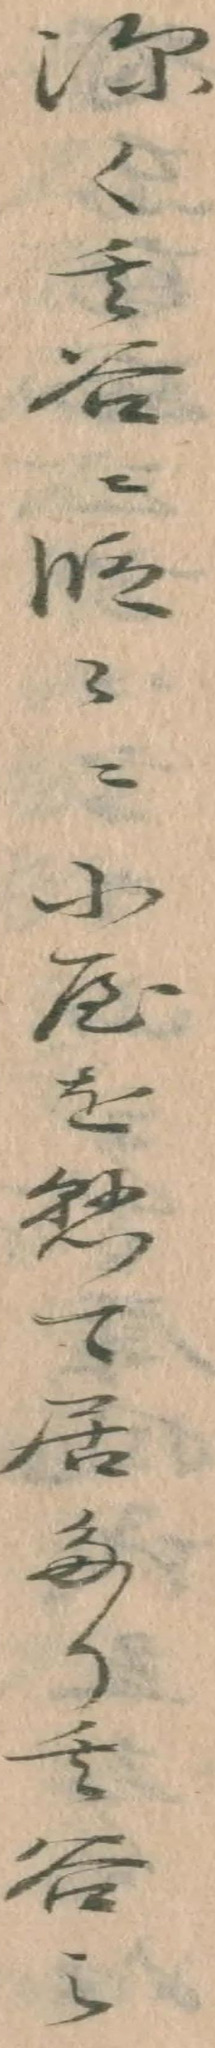深く其谷に段々に小屋を懸て居たり其谷之
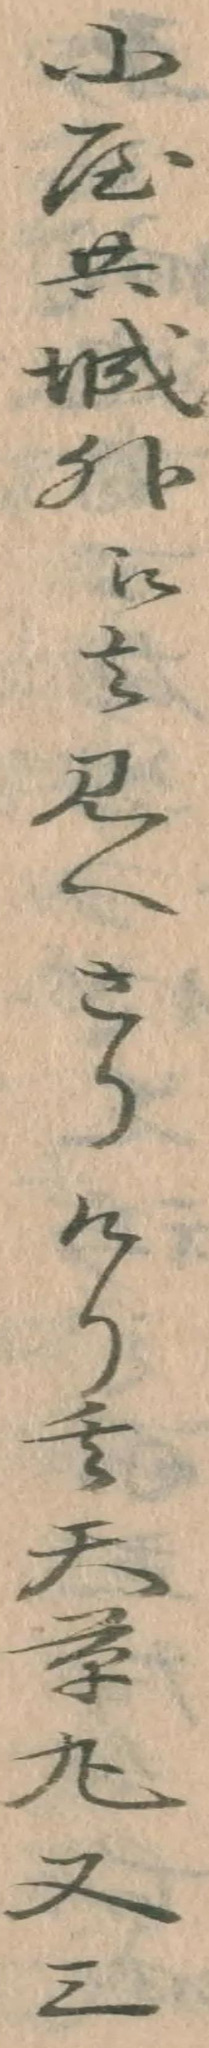小屋共城外江は見へさりけり其天草丸又三
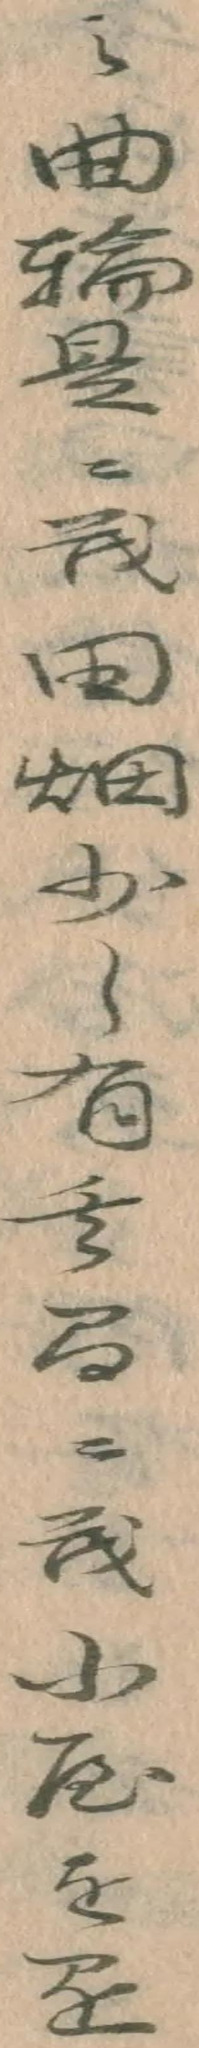之曲輪是にも田畑少し有其間にも小屋を懸
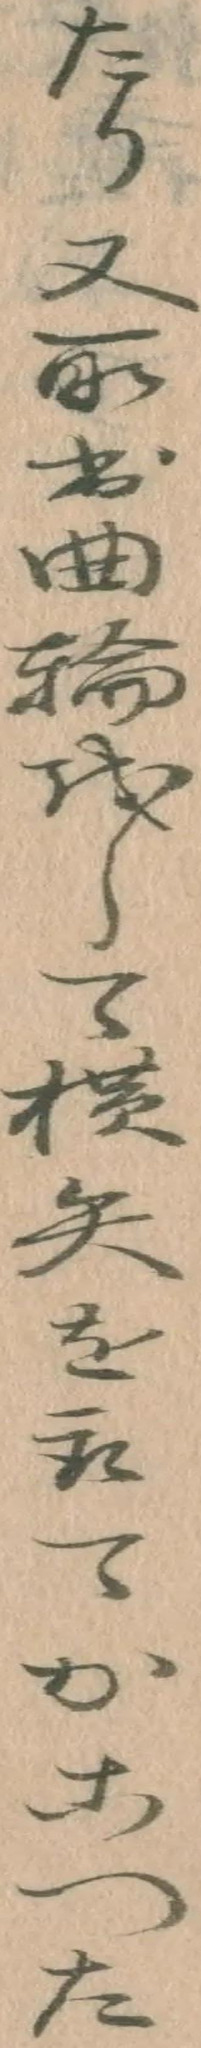たり又取出曲輪をして横矢を取てかこつた
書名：切支丹御退治記 49巻. [3]
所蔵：国立国会図書館 National Diet Library, JAPAN
